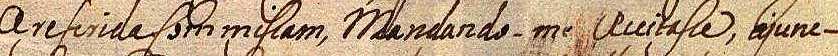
a referida Commissam, Mandando-me aceitasse, ajunc
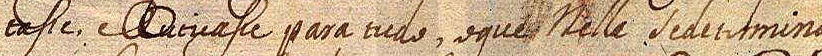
tasse, e autuasse para tudo, o que Nella se determina
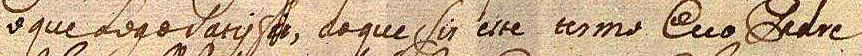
o que Logo satisfiz, do que fiz este termo eu o Padre
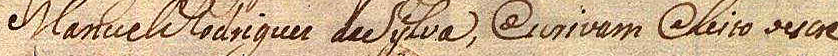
Manuel Rodriguez da Sylva, escrivam eLeito o escre
